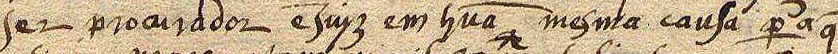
ser procurador e Juiz em hūa mesma causa ꝑa q̄
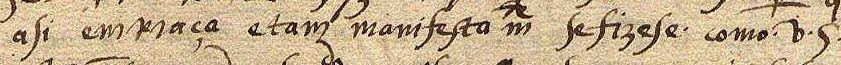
asi em praça e tam manifestamte se fizese como V. s.
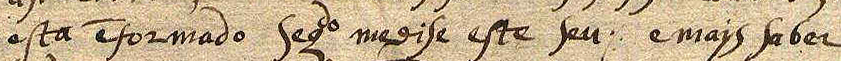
esta ēformado segdo me dise este seu /. e mays saber
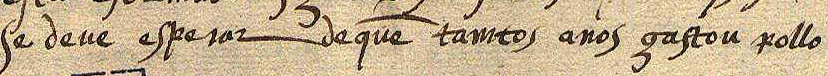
se deue esperar de quē tamtos anos gastou pollo
